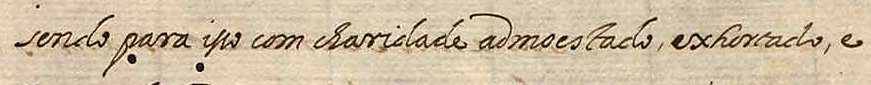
sendo para isso com charidade admoestado, exhortado, e
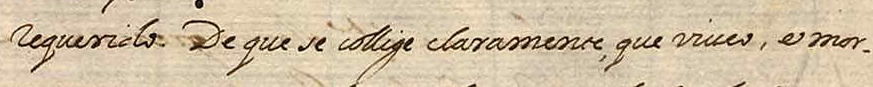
requerido. De que se collige claramente, que viueo, e mor
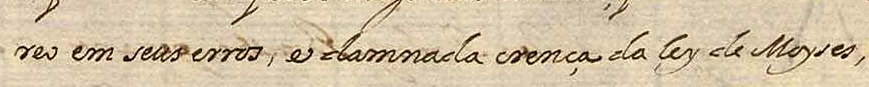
reo em seus erros, e damnada crença da ley de Moyses,
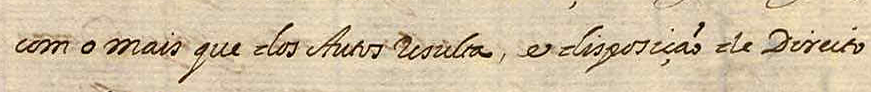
com o mais que dos Autos resulta, e disposiçaõ de Direito
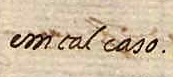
em tal caso.
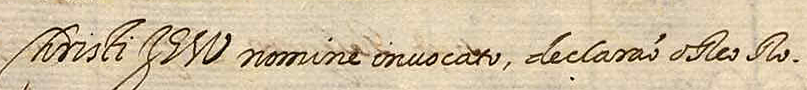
Christi JESV nomine inuocato, declaraõ o Reo Ro
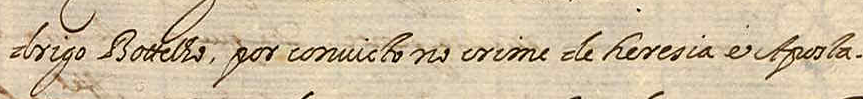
drigo Bottelho, por conuicto no crime de heresia e Aposta
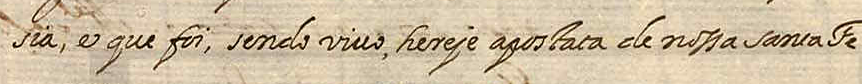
sia, e que foi, sendo viuo, hereje apostata de nossa santa Fe
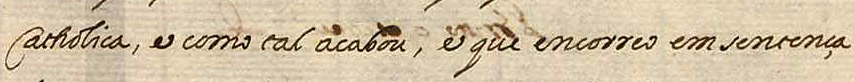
Catholica, e como tal acabou, e que encorreo em sentença
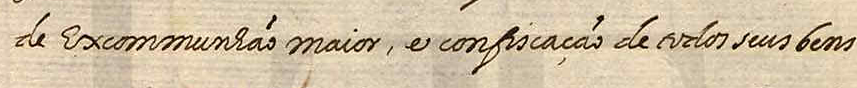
de Excommunhão maior, e confiscação de todos seus bens
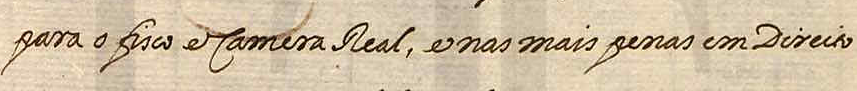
para o fisco e Camera Real, e nas mais penas em Direito
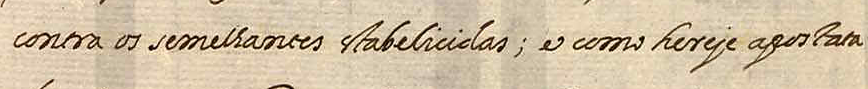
contra os semelhantes estabelicidas; e como hereje apostata
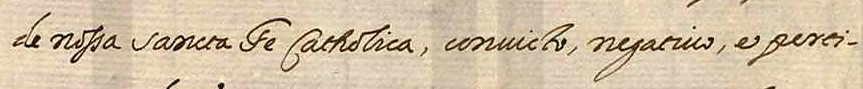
de nossa sancta Fe Catholica, conuicto, negatiuo, e perti
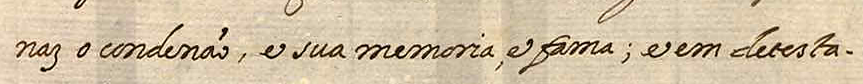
naz o condenaõ, e sua memoria, e fama; e em detesta
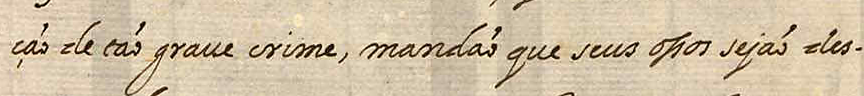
çaõ de taõ graue crime, mandaõ que seus ossos sejaõ des
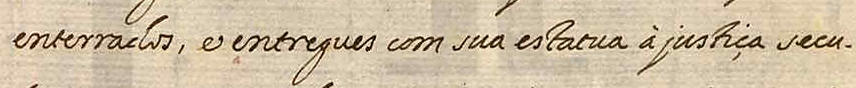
enterrados, e entregues com sua estatua à justiça secu
